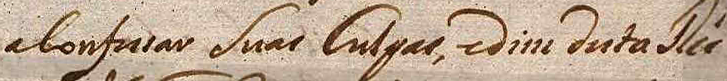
a Confessar Suas Culpas, e disse desta Reé
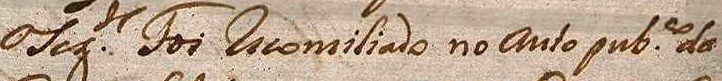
o seg.te Foi Reconsiliado no auto pub.co da
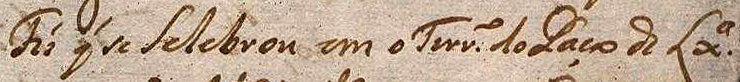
Feé q̄ se Selebrou em o Terr.o do Paço de Lx.a
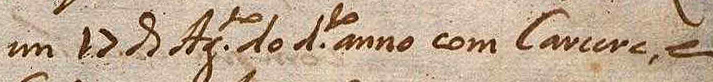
em 17 de Ag.to do d.to anno com Carcere, e
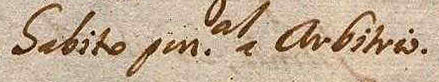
habito pen.al a arbitrio.
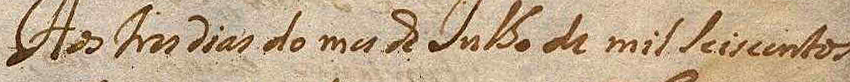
Aos tres dias do mes de Iulho de mil Seiscentos
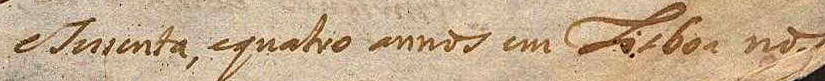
e sessenta, e quatro annos em Lisboa nos
